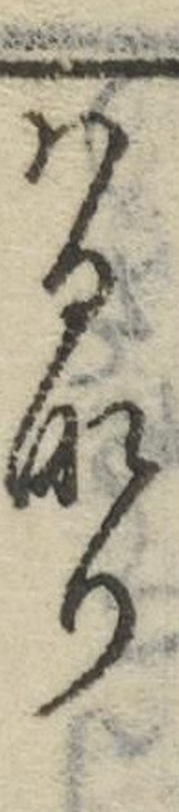はるなり
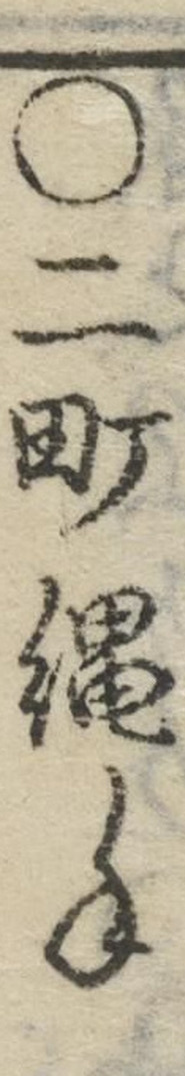〇二町縄手
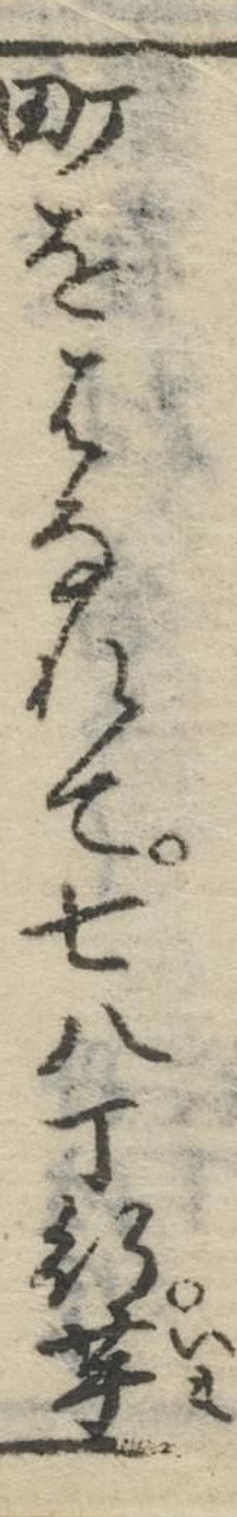町をはなれて。七八丁行。芋
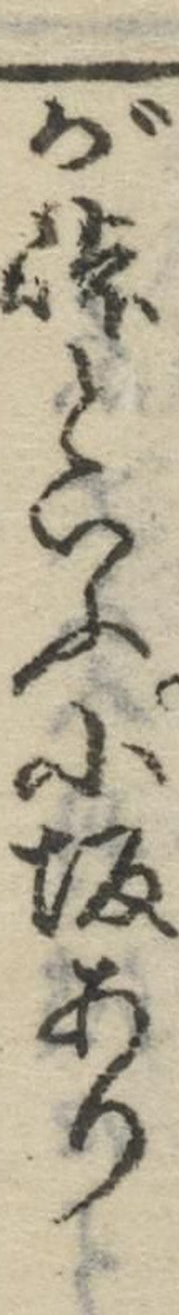が峠といふ。小坂あり
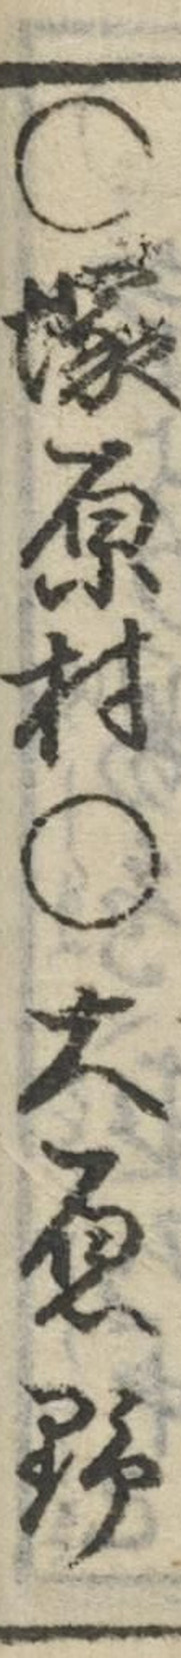〇塚原村〇大原野
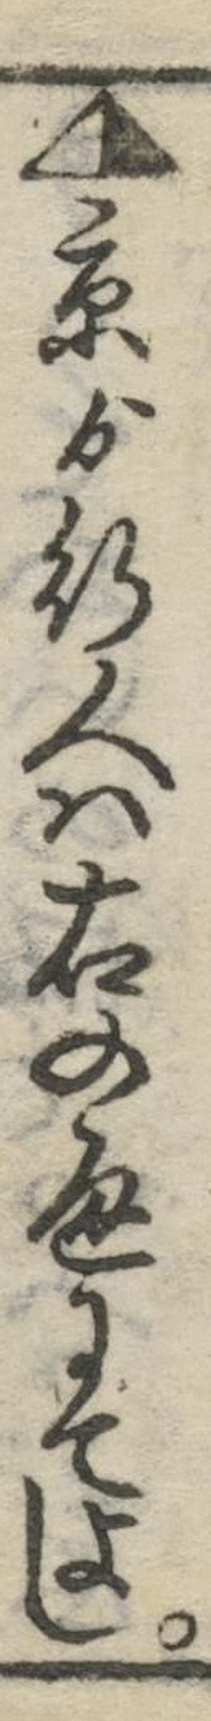▲京ゟ行人は右の通にてよし。
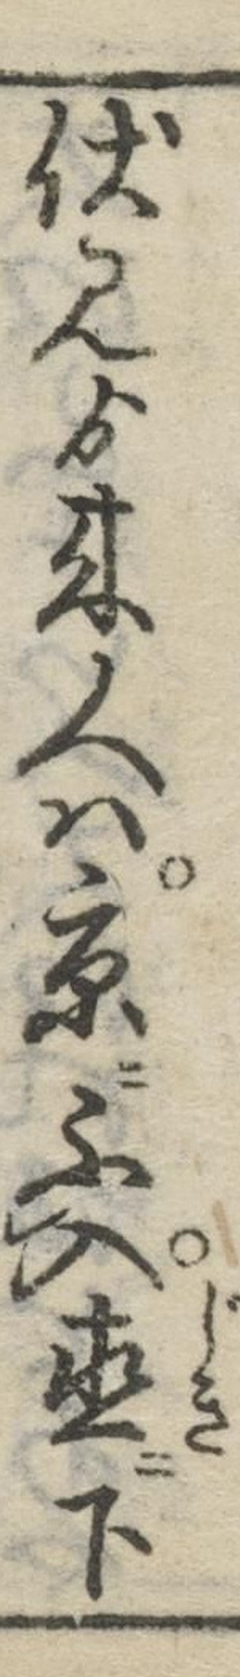伏見ゟ来人は。京に不入。直に下
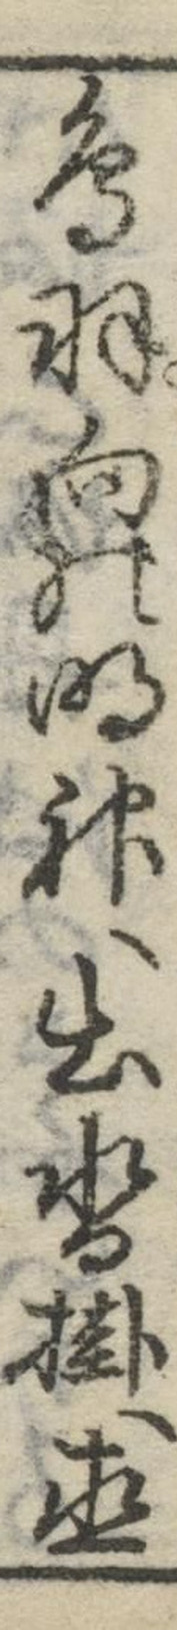鳥羽。向の明神へ出。沓掛へ直
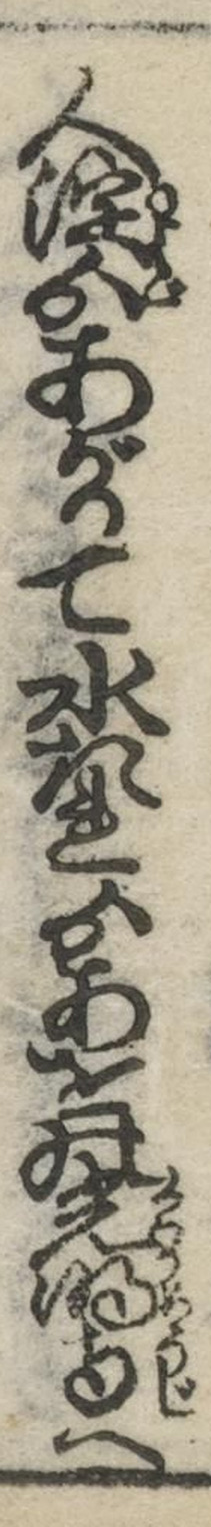人。淀ゟあがりて水たれゟあをの光明寺へ
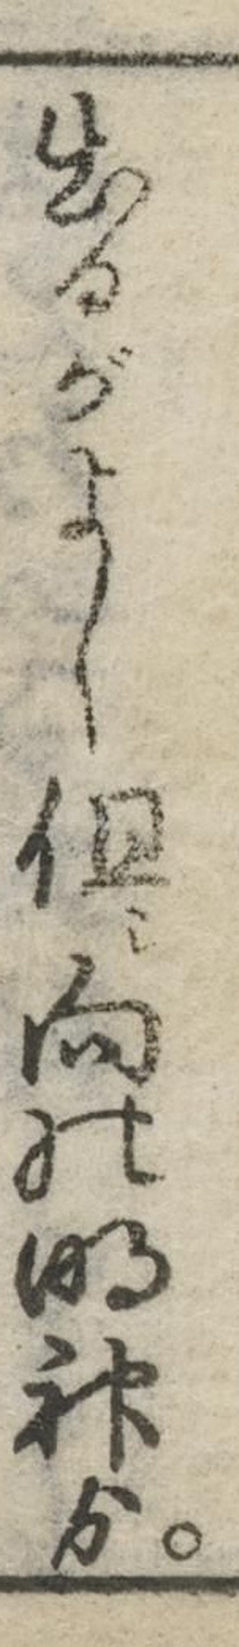出るがよし但し向の明神ゟ。
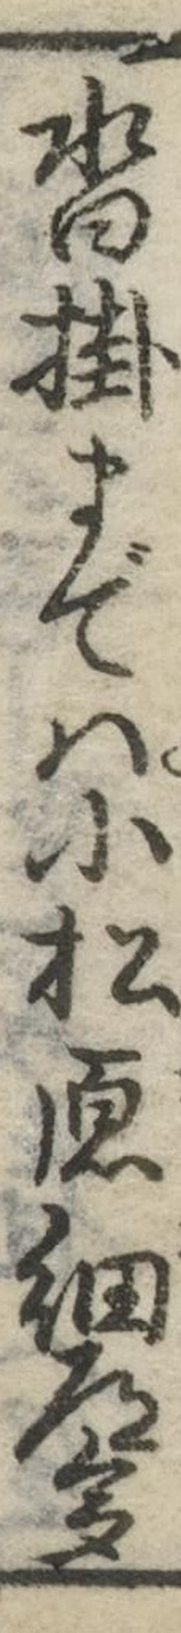沓掛までは。小松原細道多
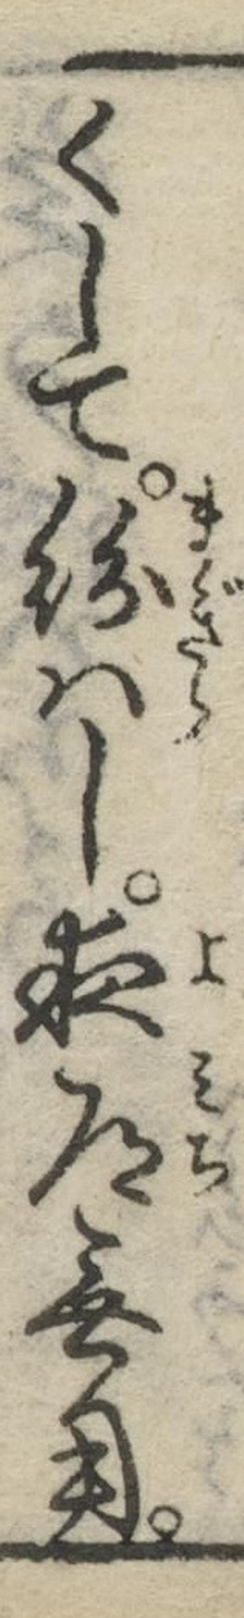くして。紛はし。夜道無用。
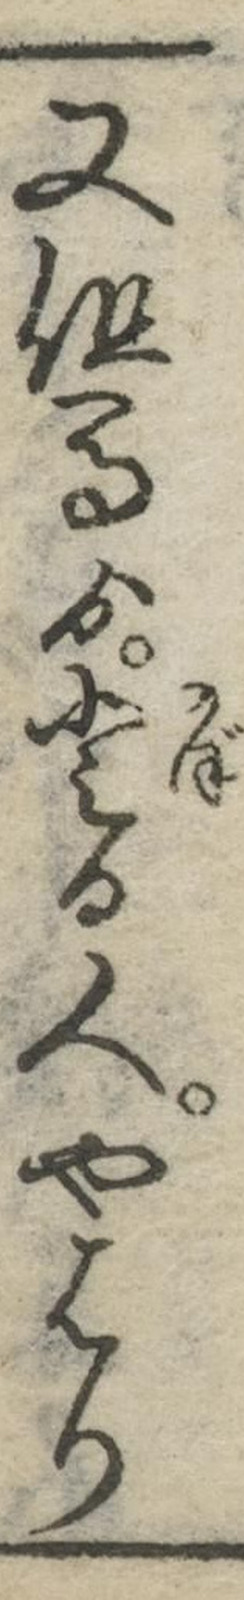又但馬ゟ。登る人。やはり

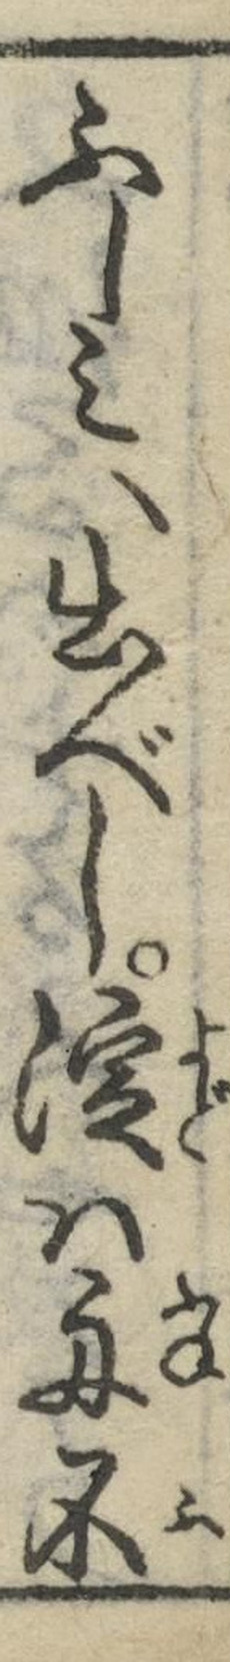ふしみへ出べし。淀は舟不
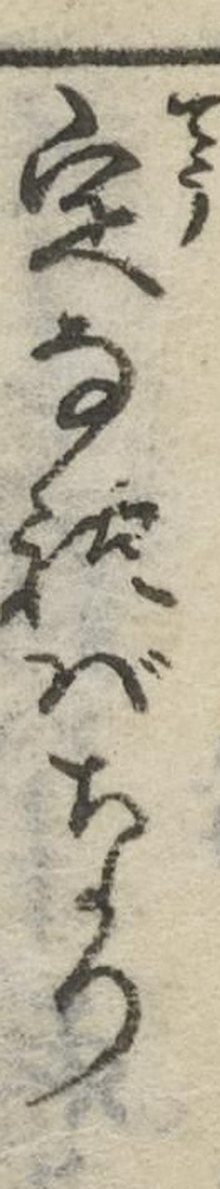定なればなり
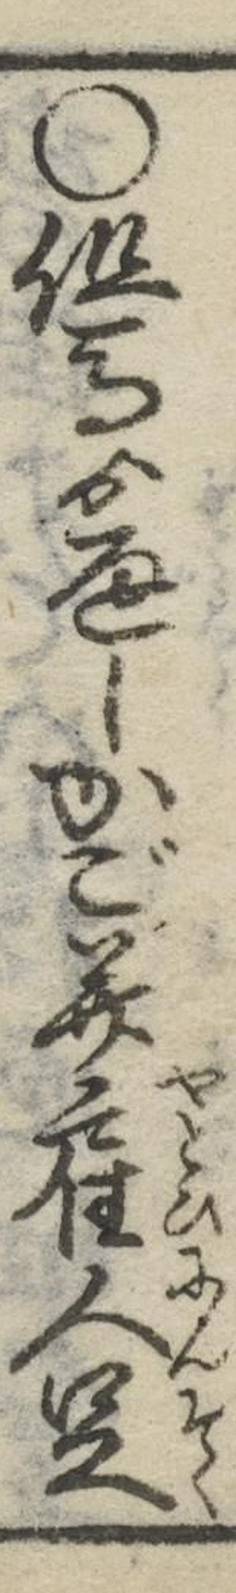〇但馬ゟ通しかご并雇人足
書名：但州城崎浴湯辧
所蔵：東京大学地震研究所図書室 Earthquake Research Institute Library, The University of Tokyo, JAPAN
